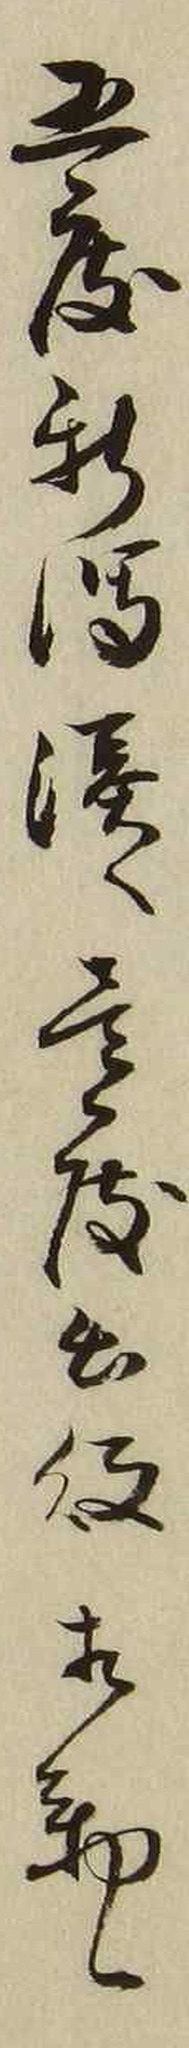五度新潟湊へ壱度出役相勤候
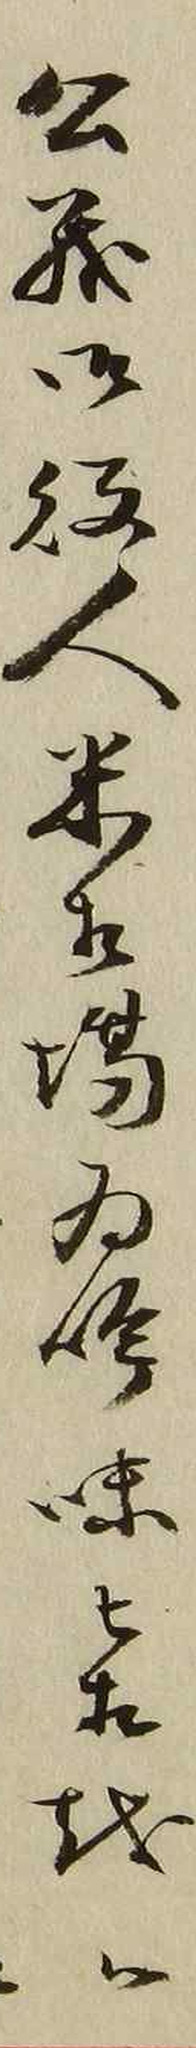公義御役人米相場為吟味被相越候
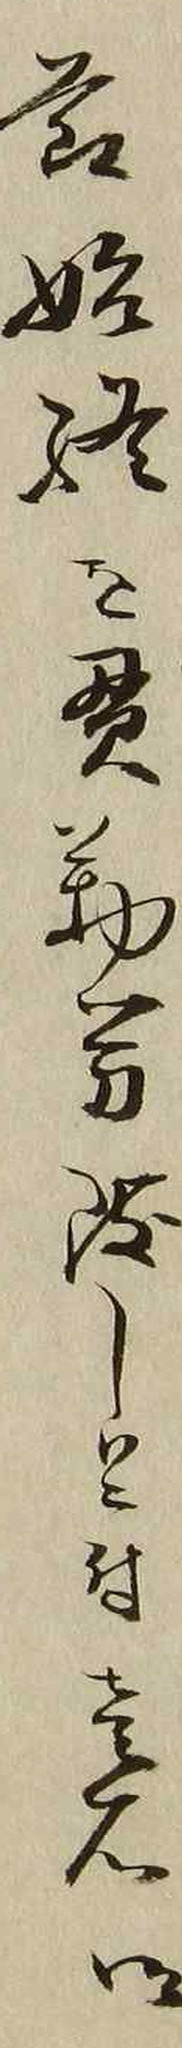節始終を貫勤労致し候ニ付壱石御
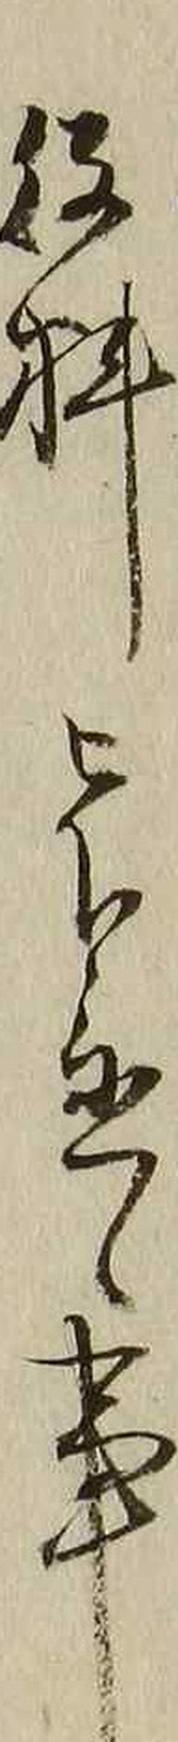役料被下置候事
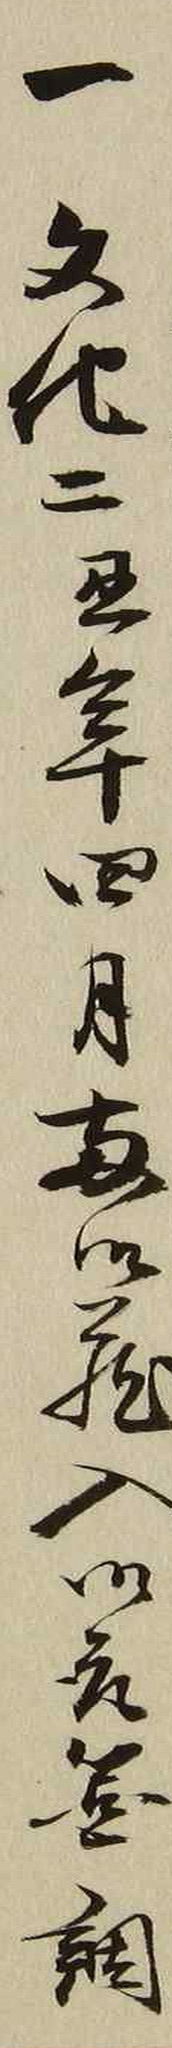一文化二丑年四月南御蔵入御取箇調
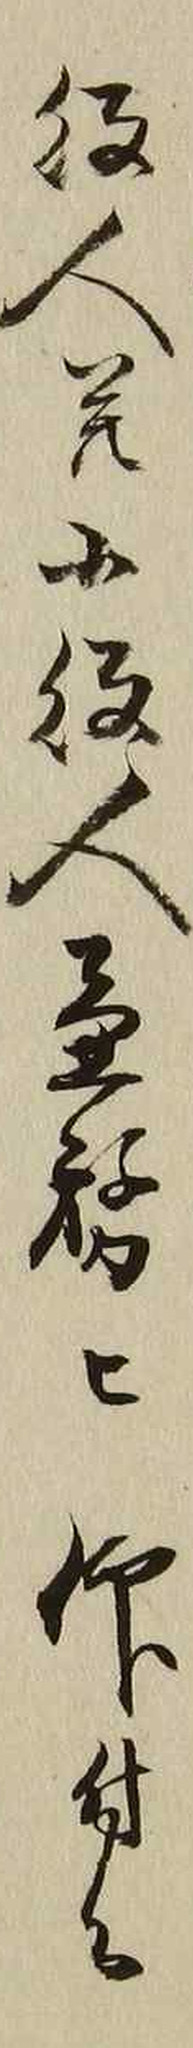役人并小役人兼務被仰付候
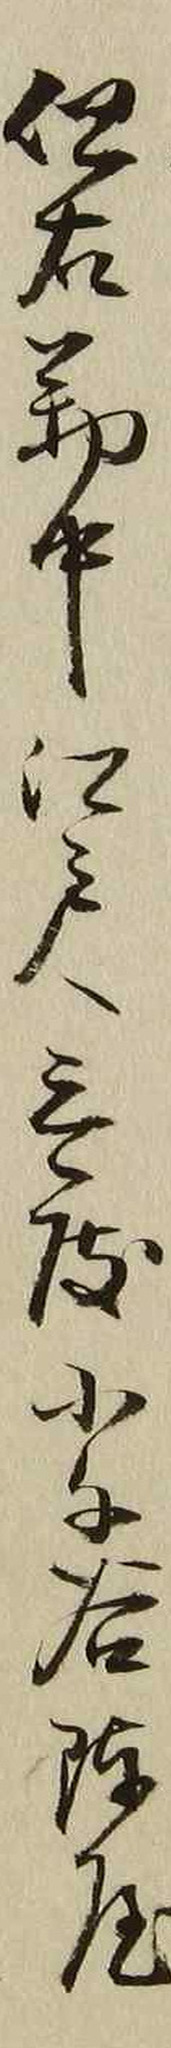但右勤中江戸へ三度小千谷陣屋
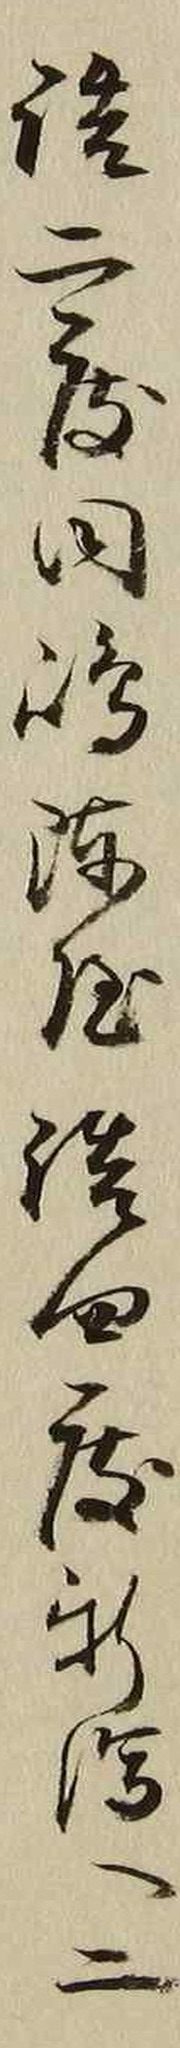詰二度岡島陣屋詰四度新潟へ二
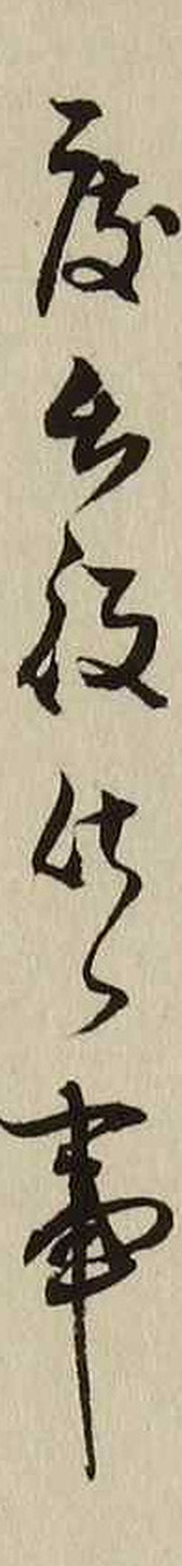度出役仕候事
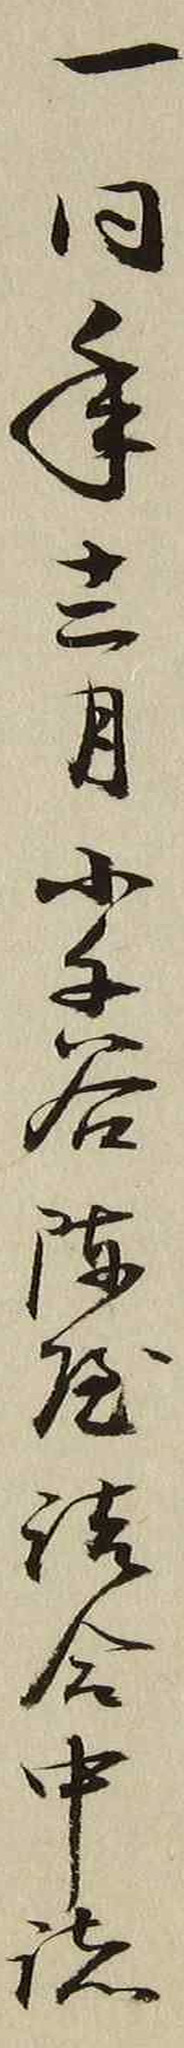一同年十二月小千谷陣屋詰合中諸
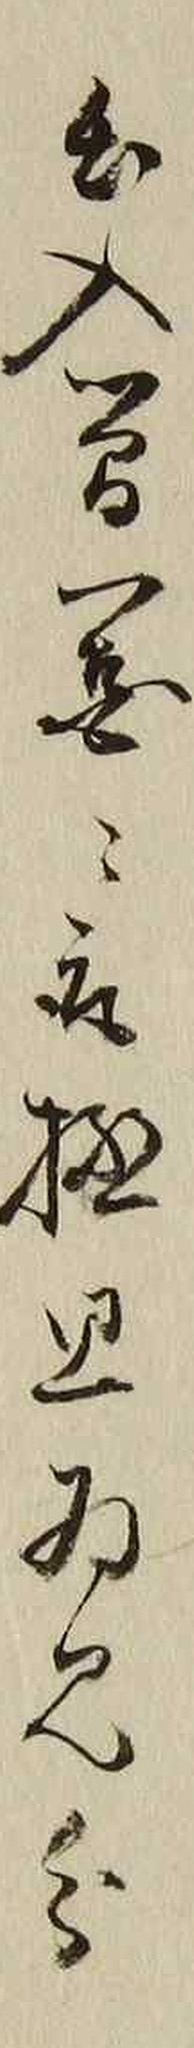出入簡箇ニ取極且為見分
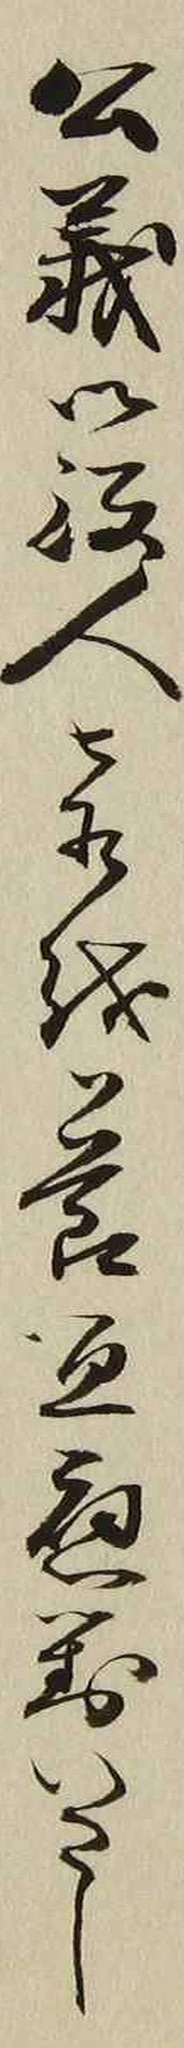公義御役人被相越候節宜応対いたし
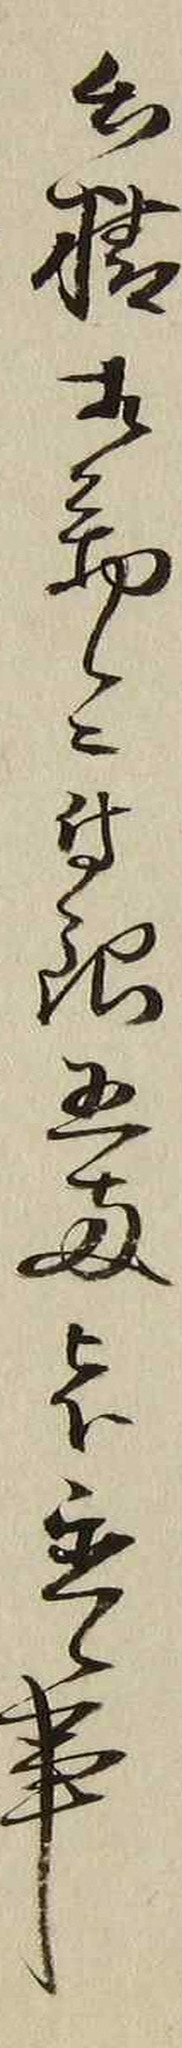出精相勤候ニ付銀五両被下置候事
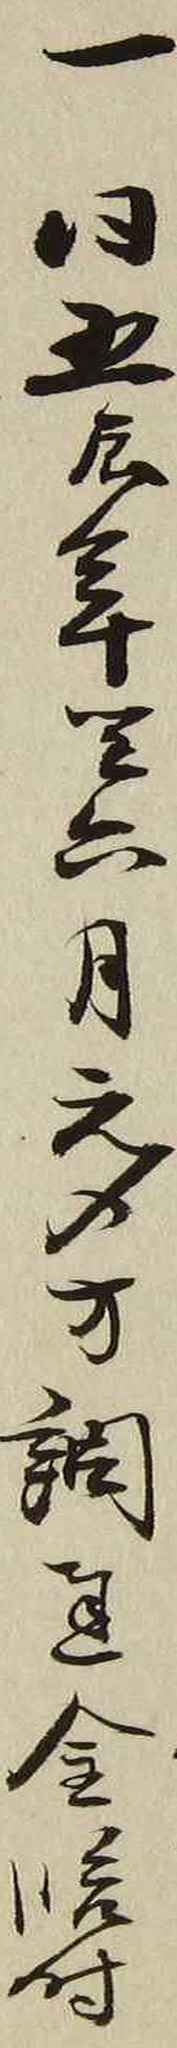一同五辰年閏六月元〆方調達金臨時
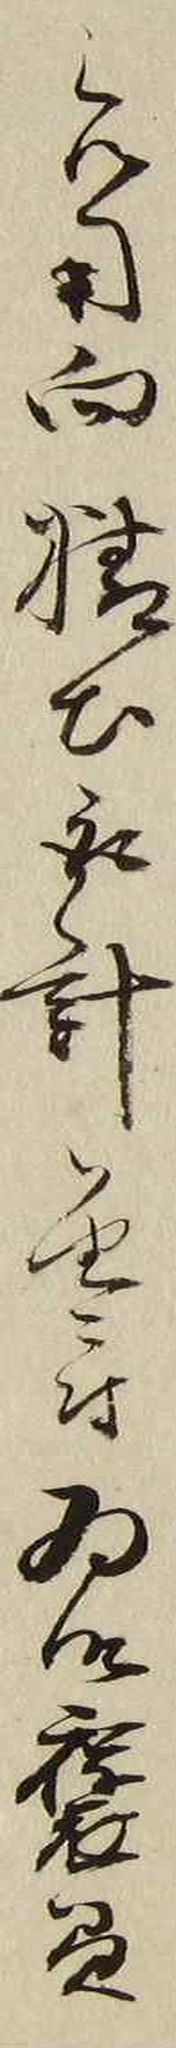之御用向精出取計候由ニ付為御褒美
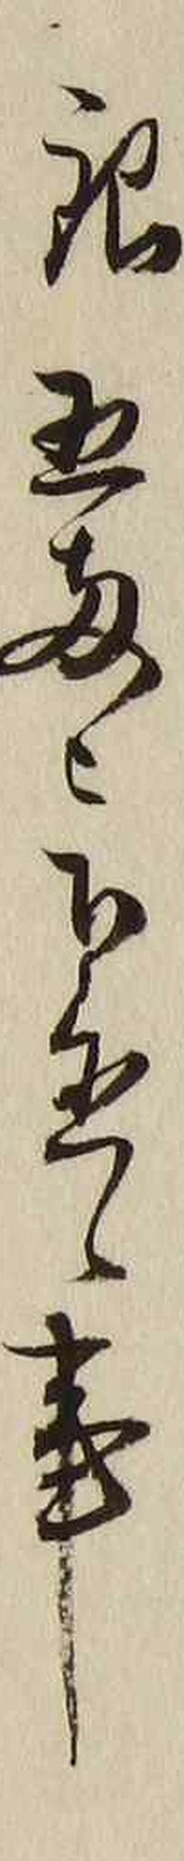銀五両被下置候事
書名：諸士系譜　巻之291　さ之部23
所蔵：会津若松市立会津図書館
